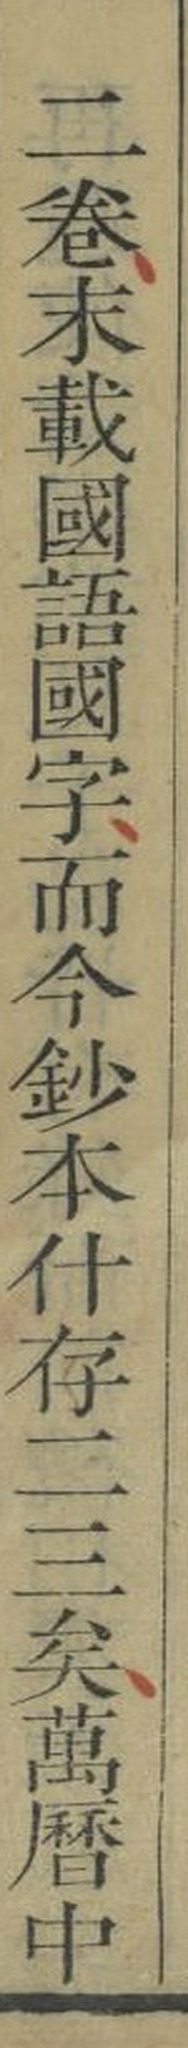二卷末載國語國字而今鈔本什存二三矣萬曆中

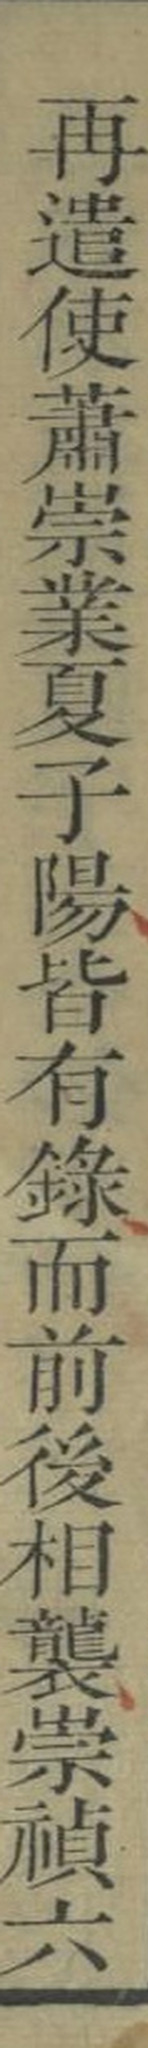再遣使蕭崇業夏子陽皆有錄而前後相襲崇禎六
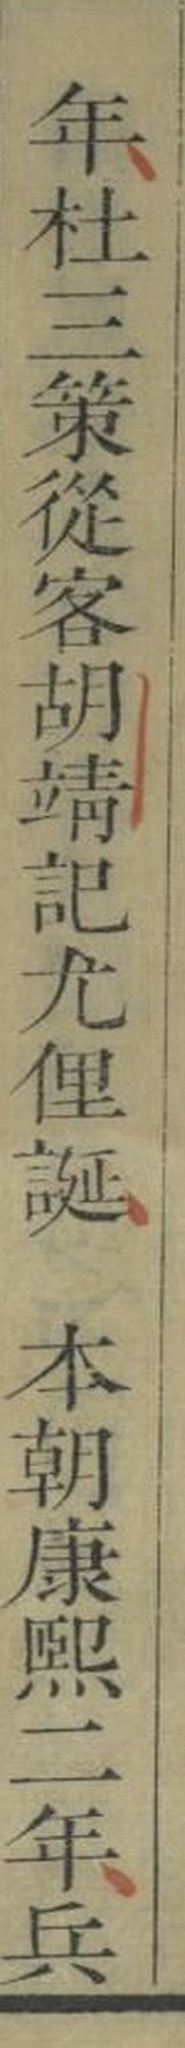年杜三策從客胡靖記尤俚誕本朝康煕二年兵
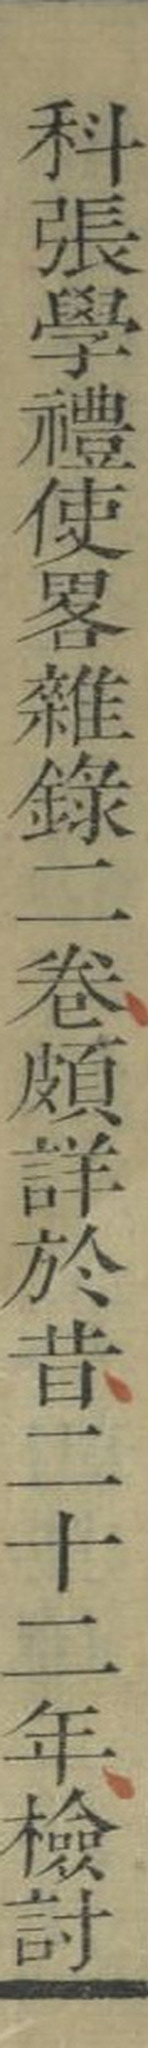科張學禮使畧雜錄二卷頗詳於昔二十二年檢討
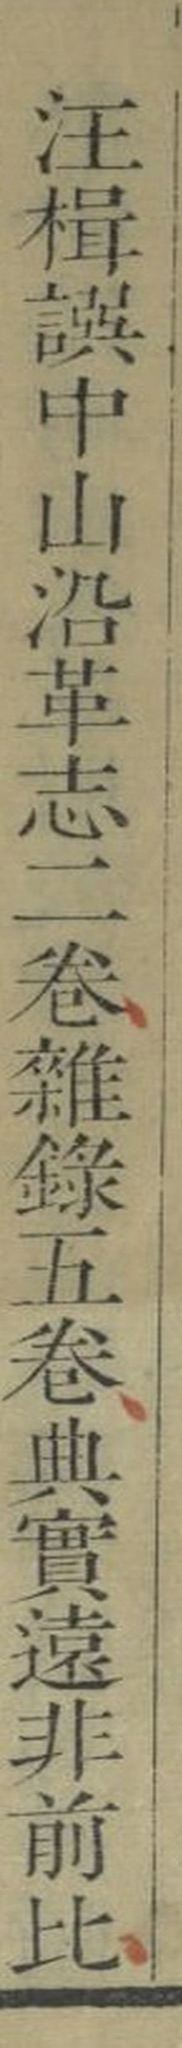汪楫譔中山沿革志二卷雜錄五卷典實遠非前比
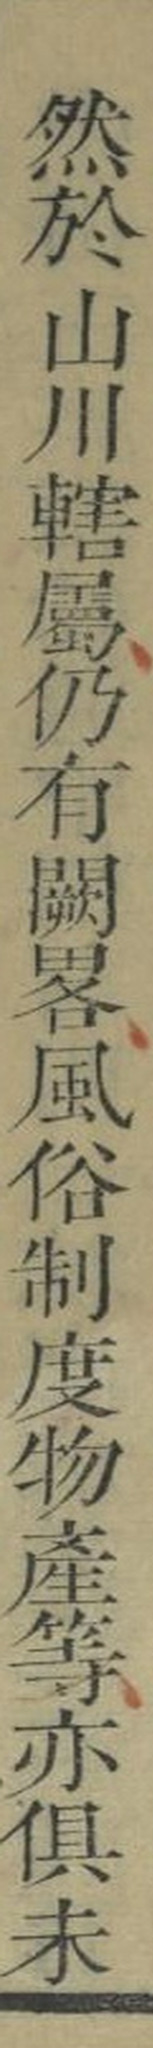然於山川轄屬仍有闕畧風俗制度物產等亦俱未
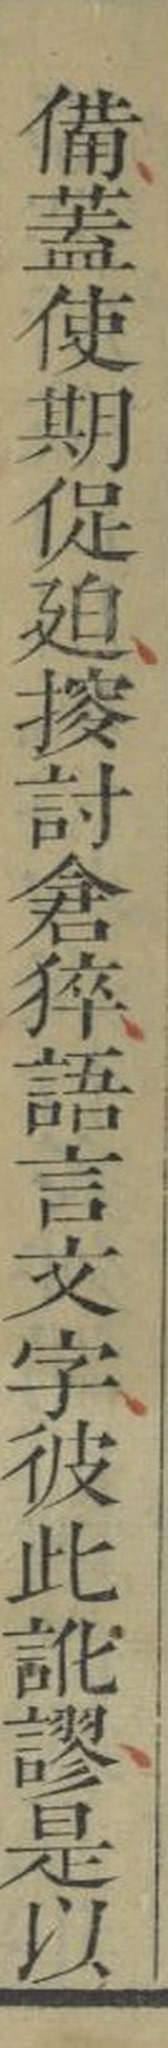備蓋使期促廹摉討倉猝語言文字彼此訛謬是以
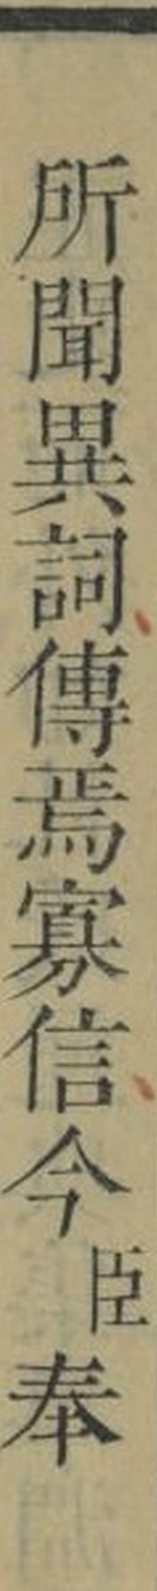所聞異詞傳焉寡信今臣奉
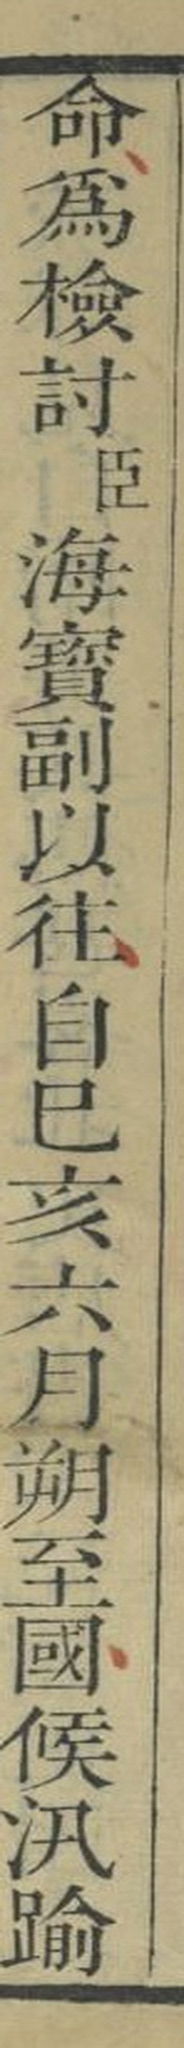命爲檢討臣海寳副以往自巳亥六月朔至國候汛踰
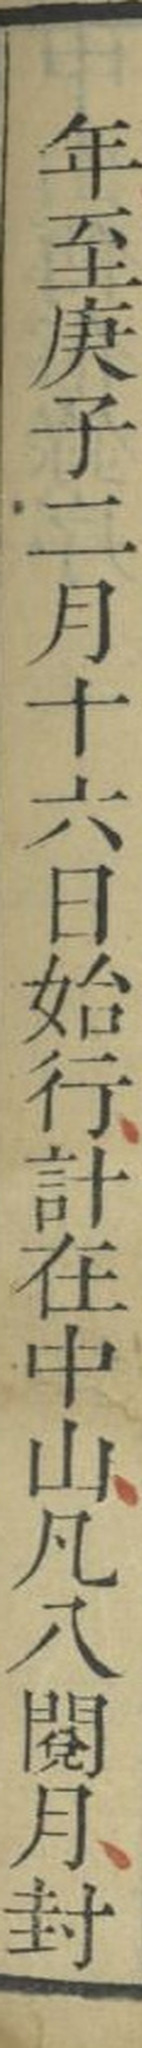年至庚子二月十六日始行計在中山凡八閱月封
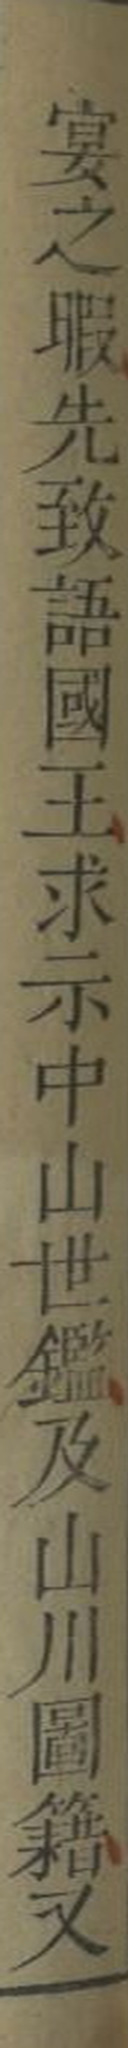宴之暇先致語國王求示中山世鑑及山川圖籍又
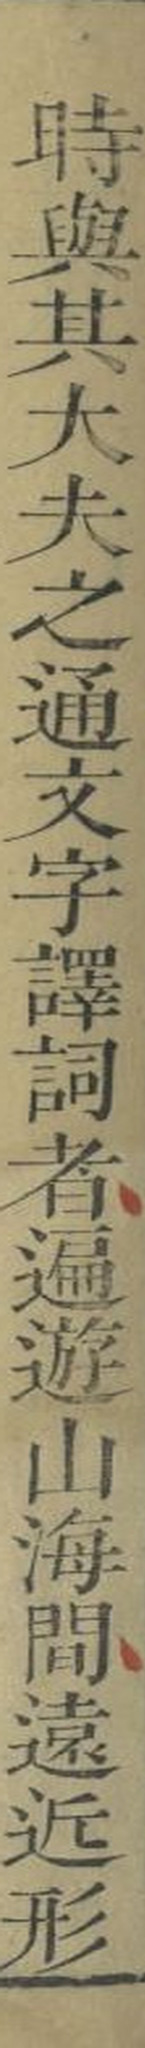時與其大夫之通文字譯詞者遍遊山海間遠近形
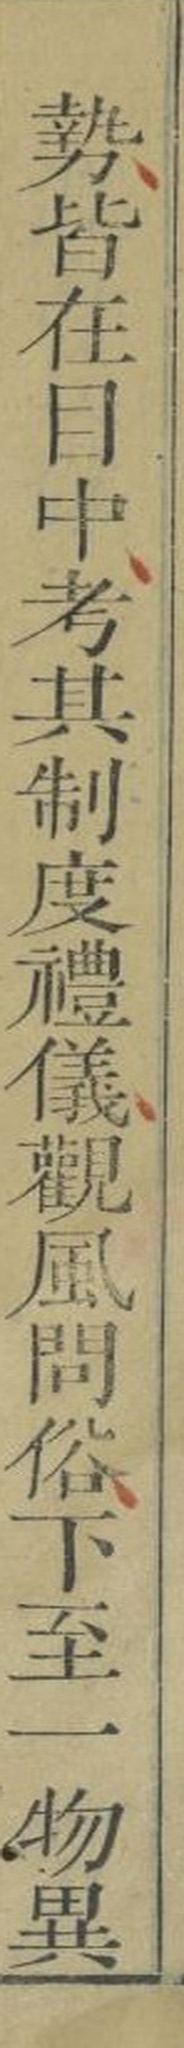勢皆在目中考其制度禮儀觀風問俗下至一物異
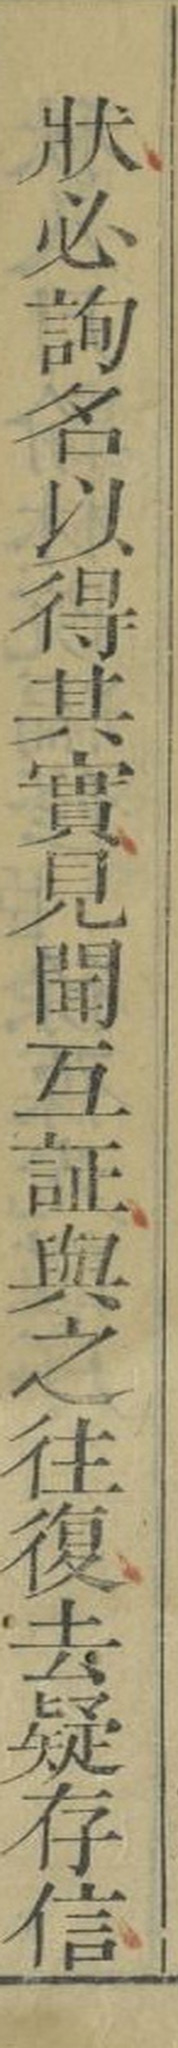狀必詢名以得其實見聞互証與之往復去疑存信
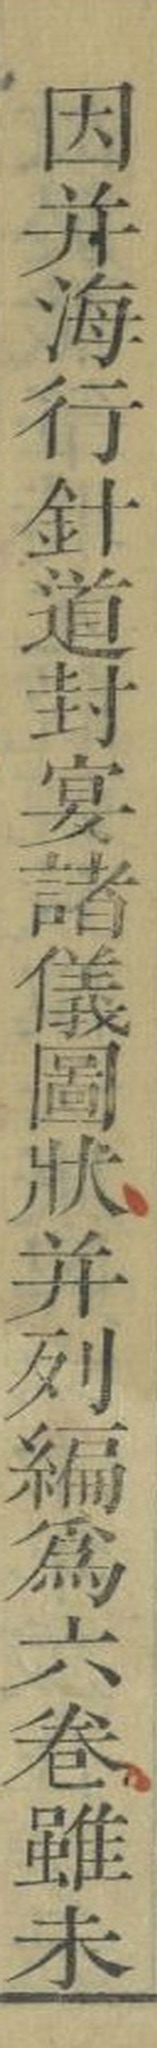因并海行針道封宴諸儀圖狀并列編爲六卷雖未
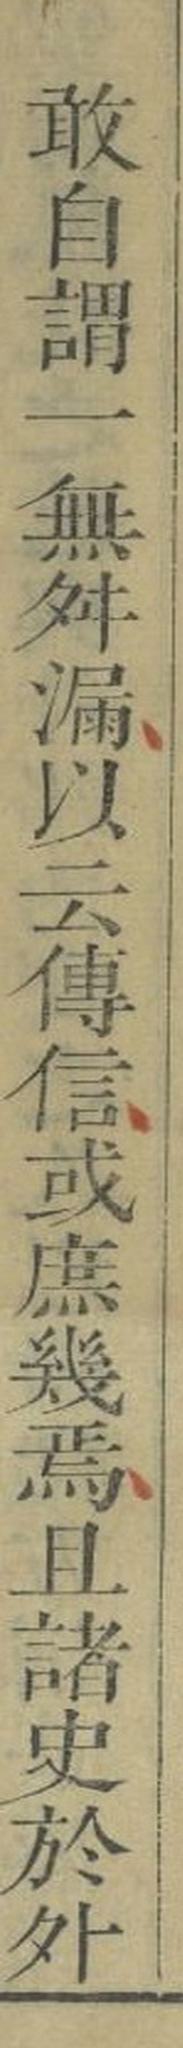敢自謂一無舛漏以云傳信或庶幾焉且諸史於外
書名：中山伝信録 巻一、巻二
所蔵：University of the Ryukyus Library
